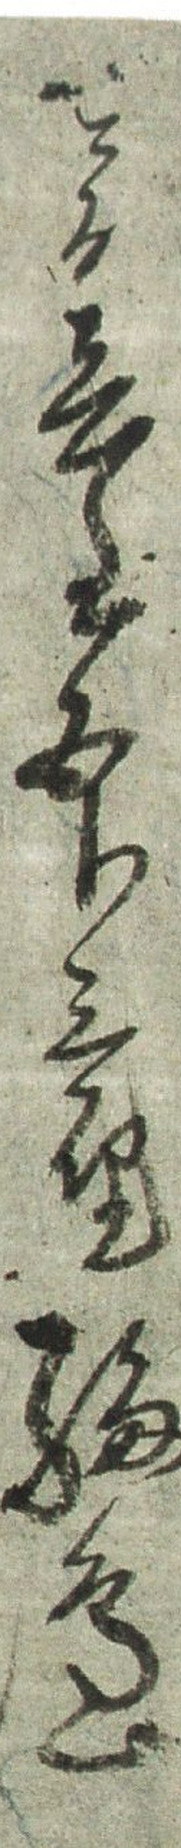にて壱匁五分三厘福島
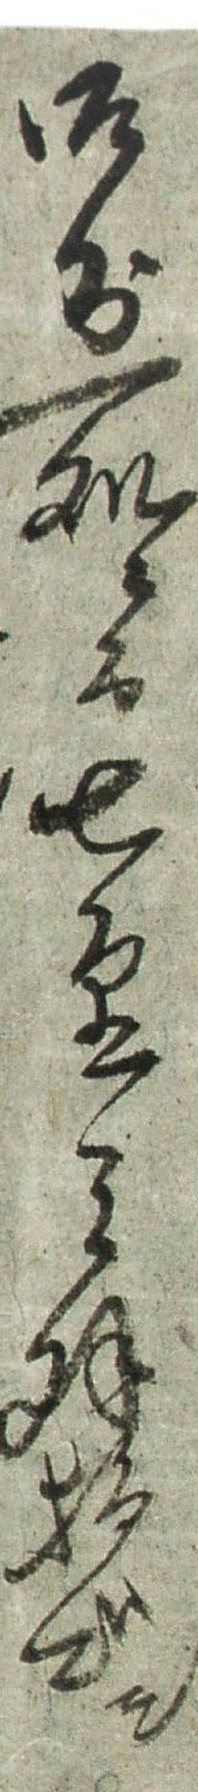御分一処にて七厘之外指出し
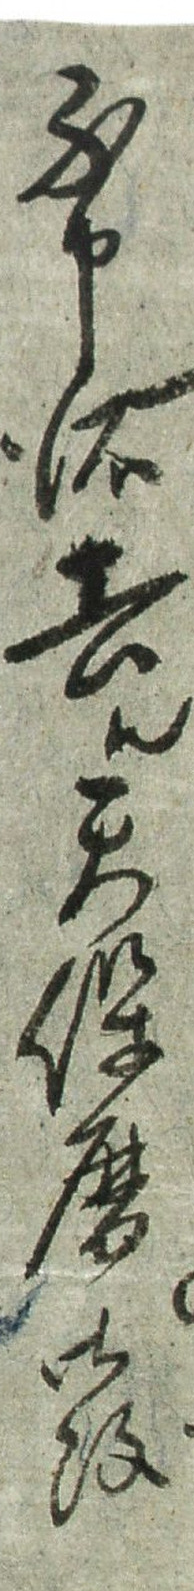不申所去る天保暦御改
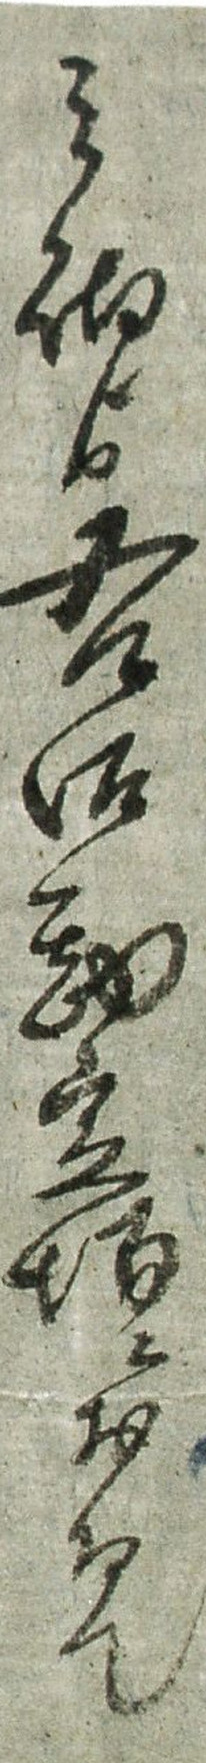之砌ゟ右御勘定場におゐて
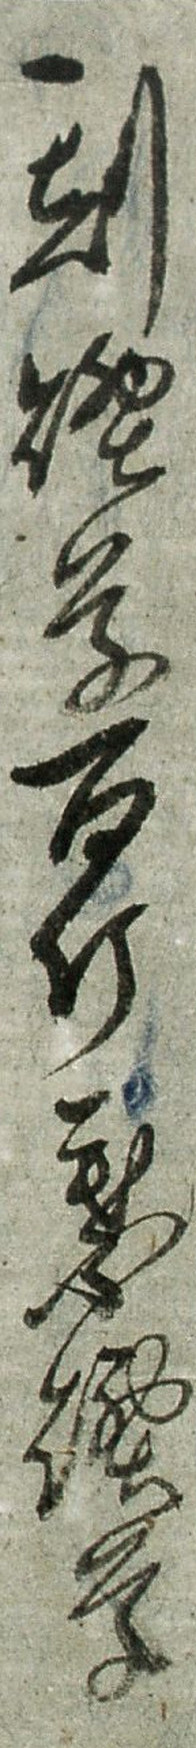刻煙草百斤葉煙草
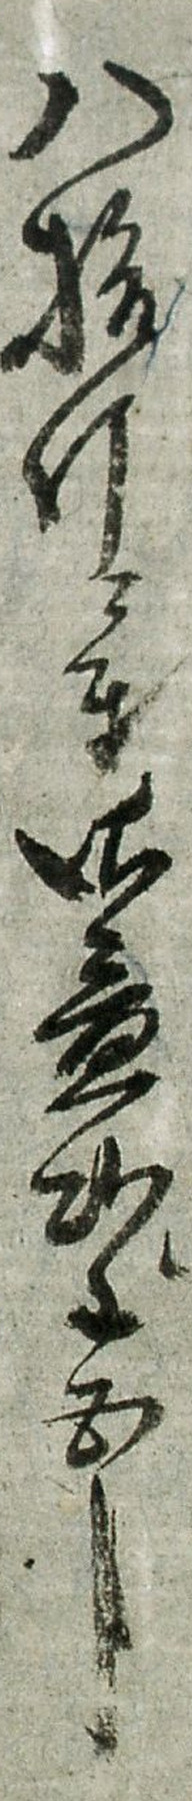八拾斤に付御意弐匁五分
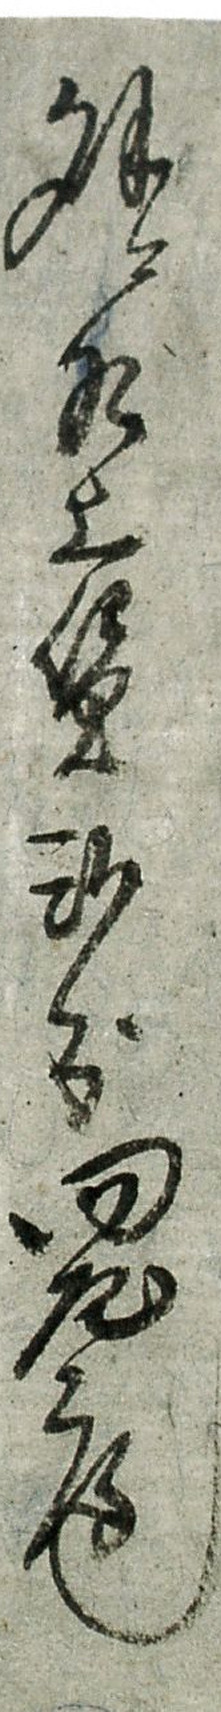外に水上賃弐分問屋庭
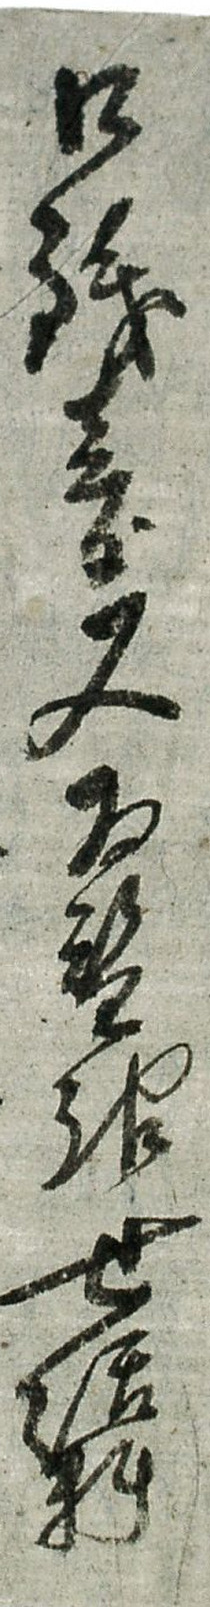口銭壱匁又為替銀世話料
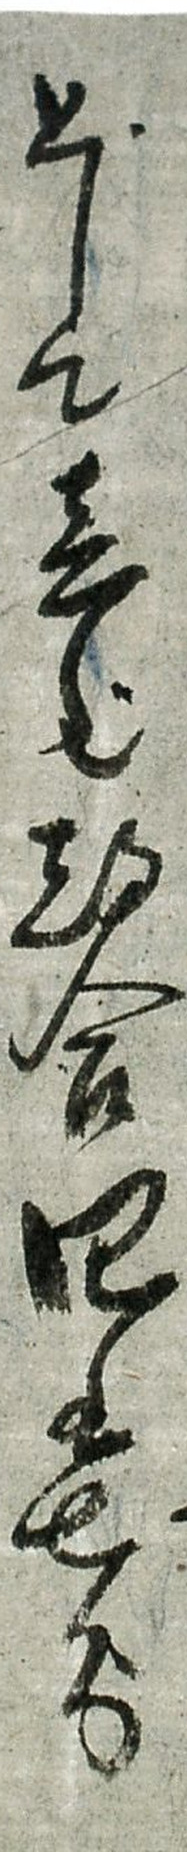として壱匁都合四匁七分
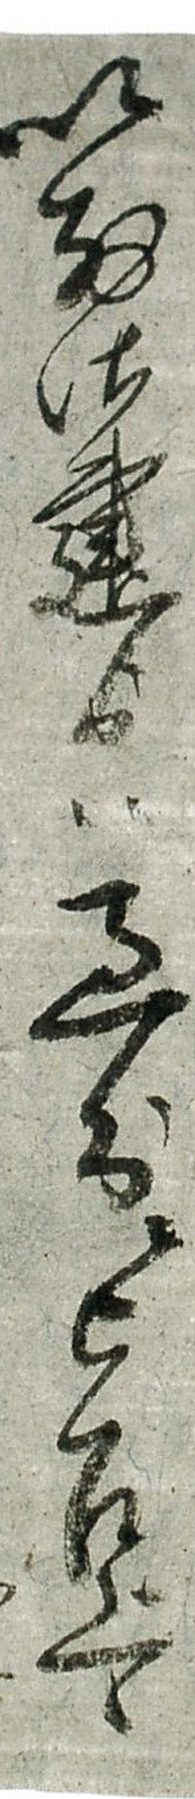以前御建ゟは過分に被召上候
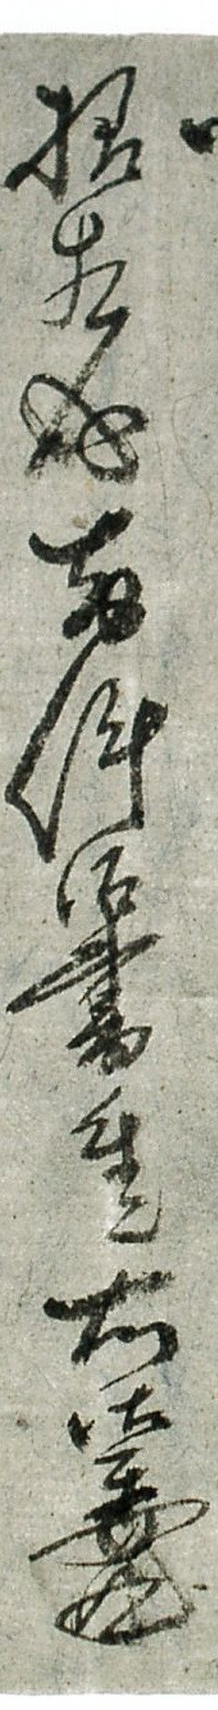様相成前件御書付に右御委曲
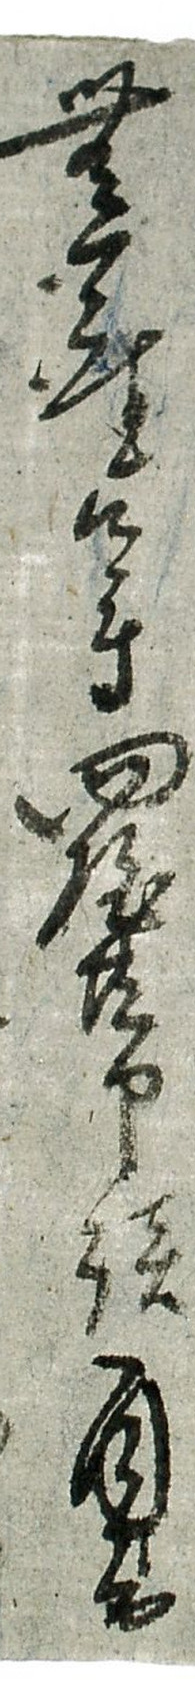無御座候付問屋共申談自分
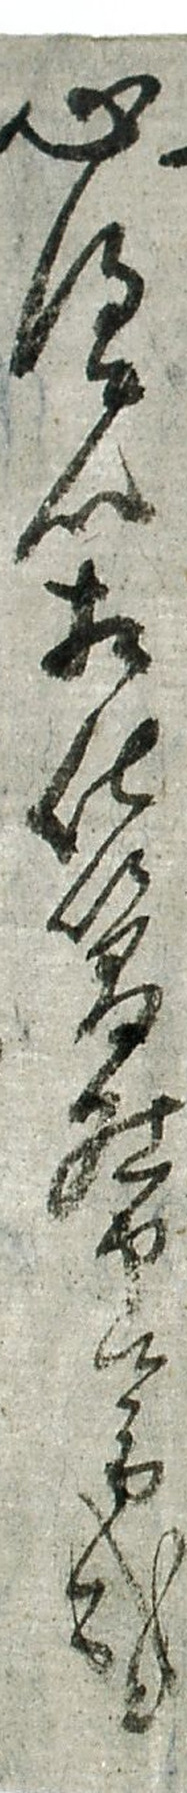心得を以相化簡居申候方哉と
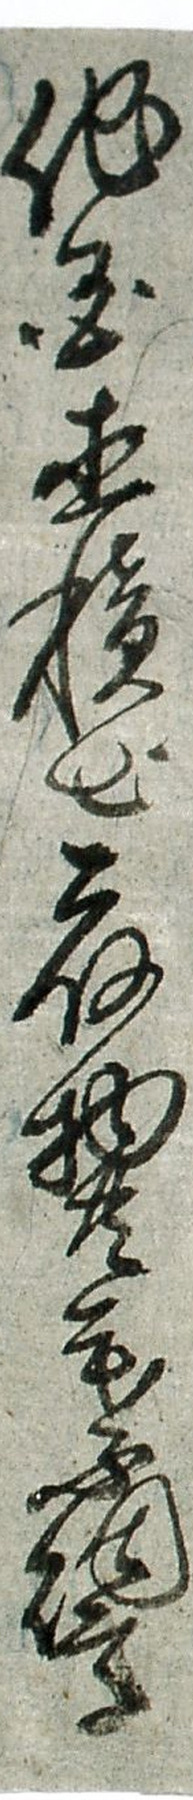他国直積出荷物共葉烟草
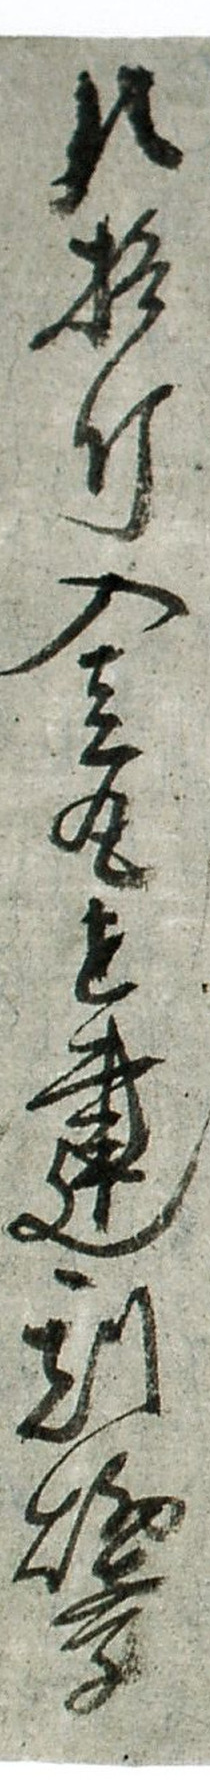八拾斤入壱丸を建刻煙草
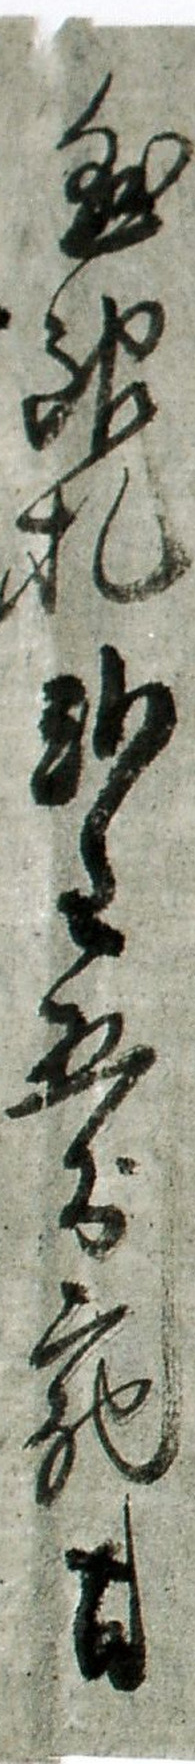懸銀札弐匁五分宛被
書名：(美馬三好両郡百姓共煙草問屋壱手勘定ニ相成迷惑願右始末承申上書付之写）
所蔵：鳴門教育大学 Naruto University of Education
